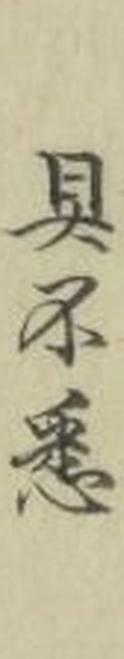具不悉
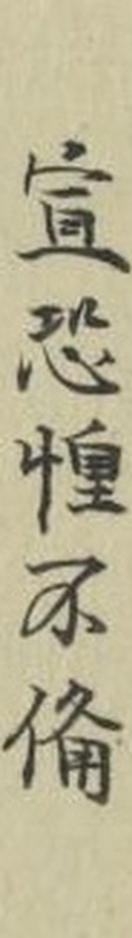宣恐惶不備
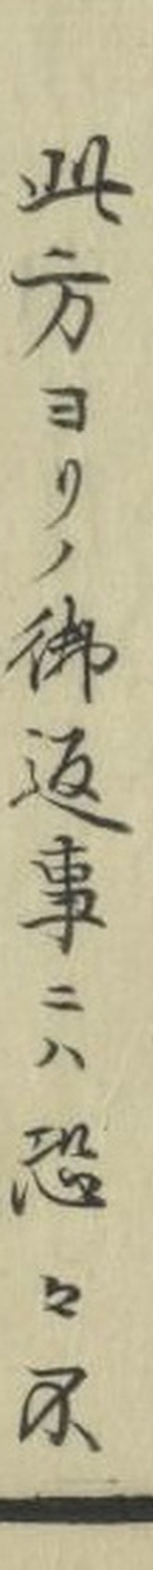此方ョㇼノ御返事ニハ恐々不
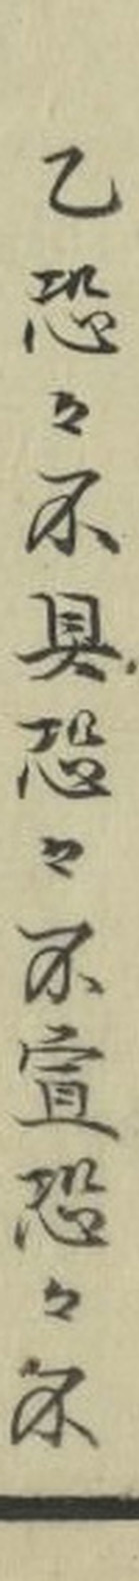乙恐々不具恐々不宣恐々不
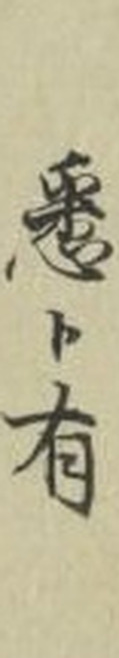悉ㇳ有
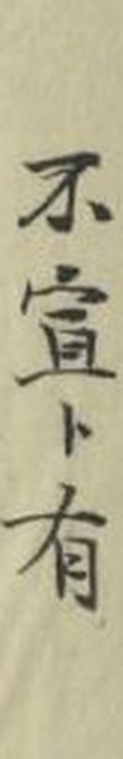不宣ㇳ有
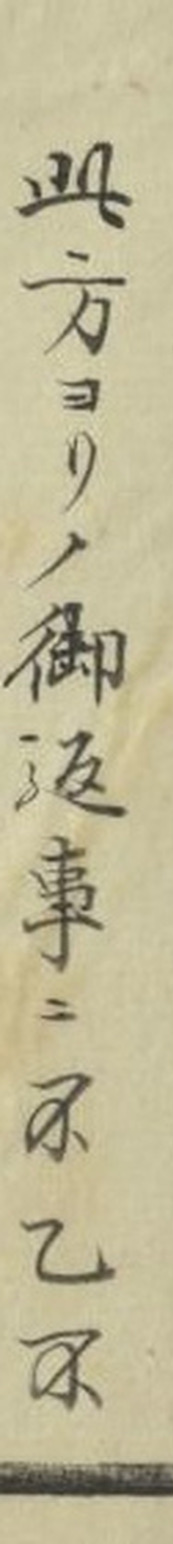此方ョㇼノ御返事ニ不乙不
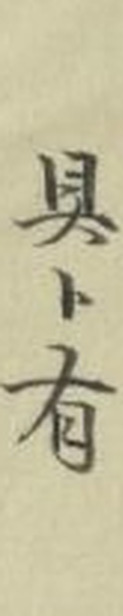具ㇳ有
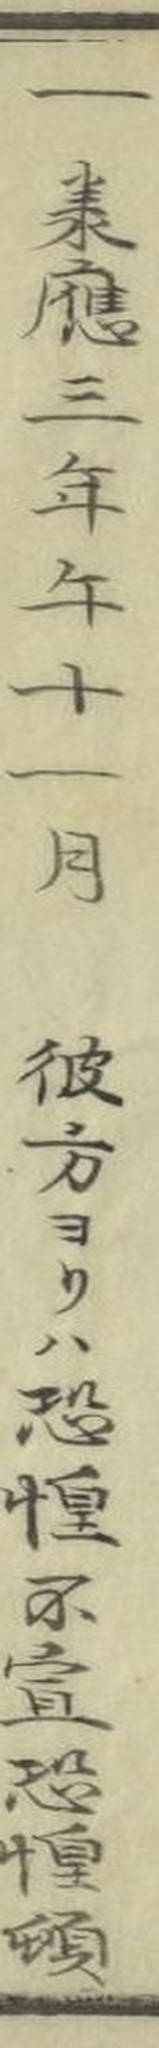一承応三年午十一月彼方ョㇼㇵ恐惶不宣恐惶頓
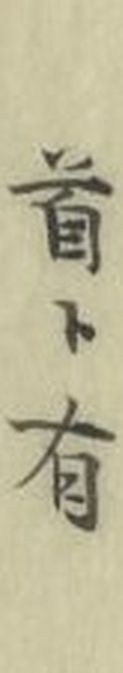首ㇳ有
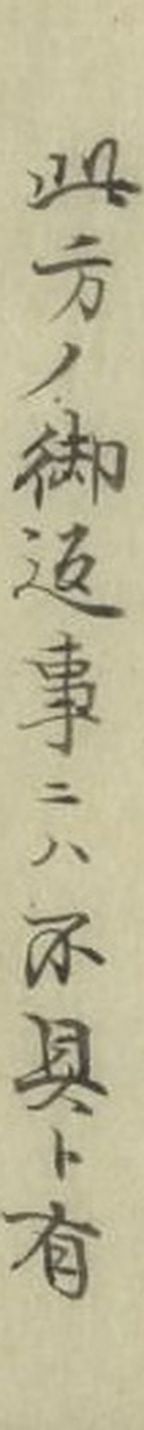此方ノ御返事ニハ不具ㇳ有
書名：琉球往来（上）
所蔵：University of the Ryukyus Library
